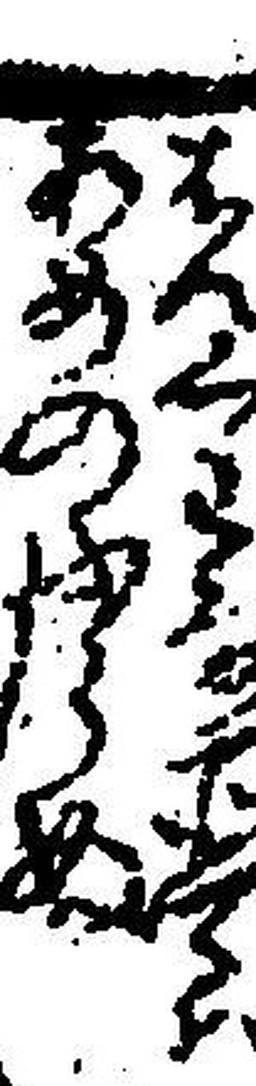あめのふらぬ
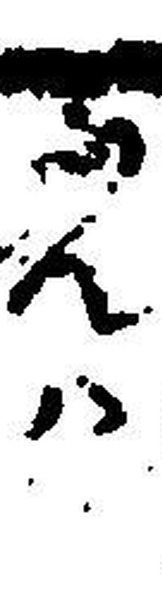ふんは
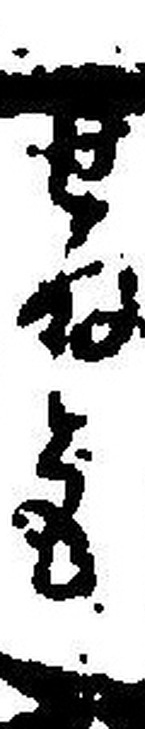せねども
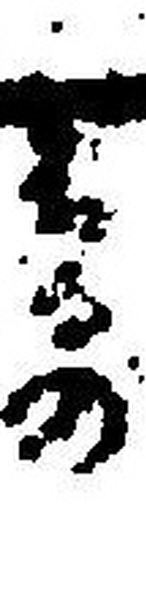はるの
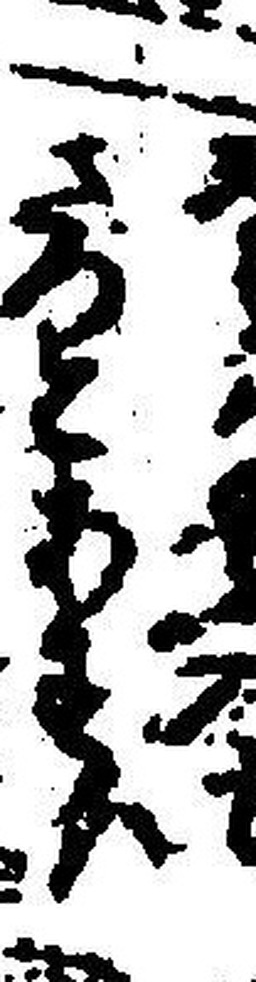さつとあすは
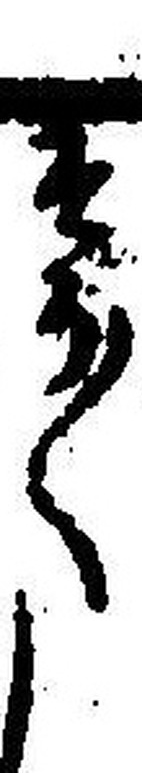そう〳〵
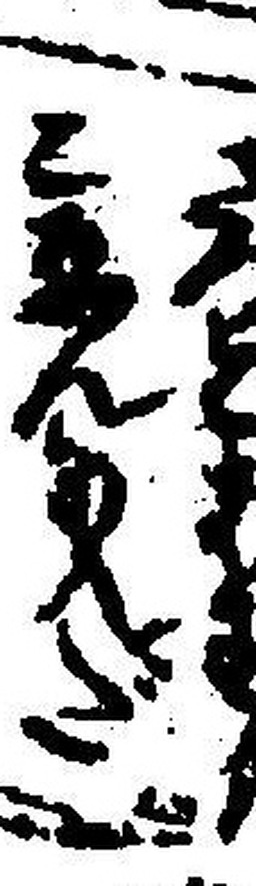こゑんもんだ
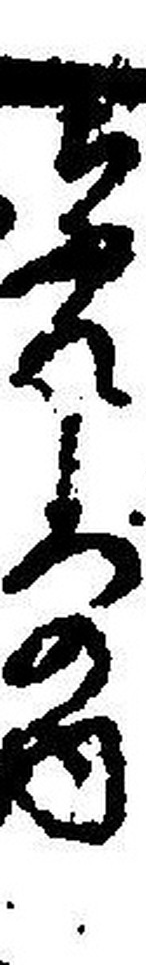ちふんしろの内
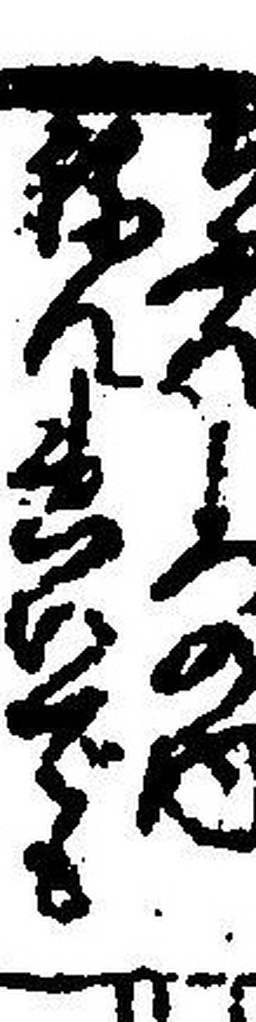ねんれいでも
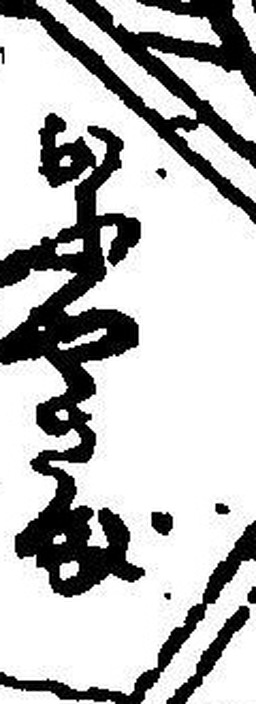おふやさま
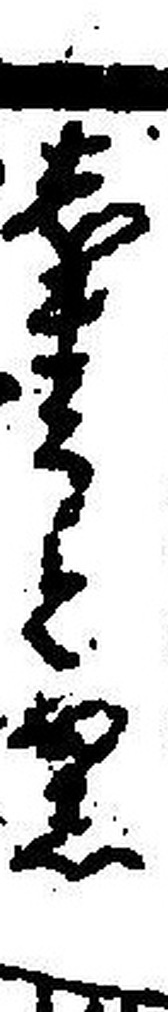しまうとおし
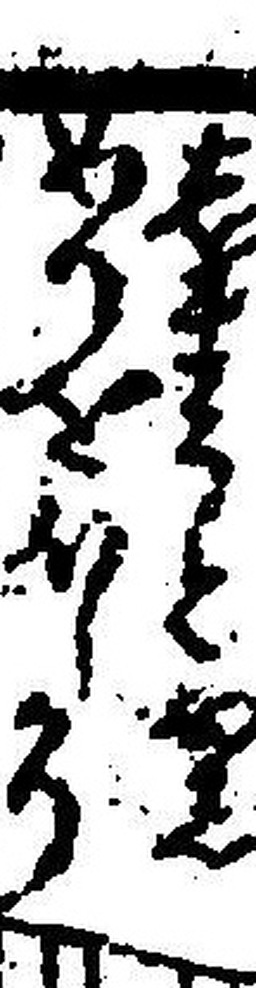めりをほしかり
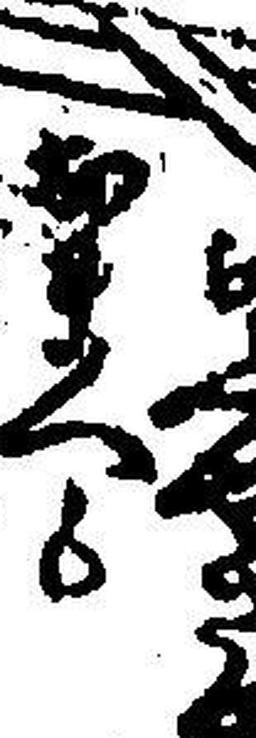おまへも
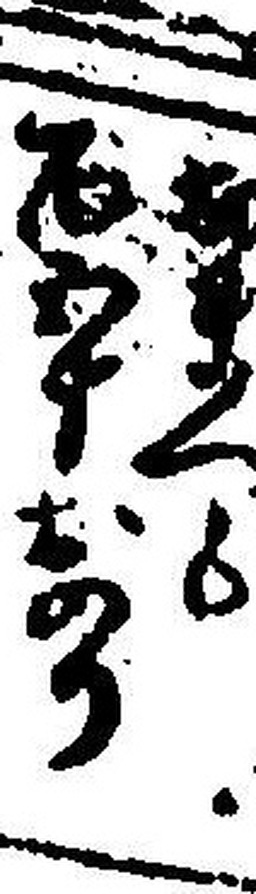百五十おのり
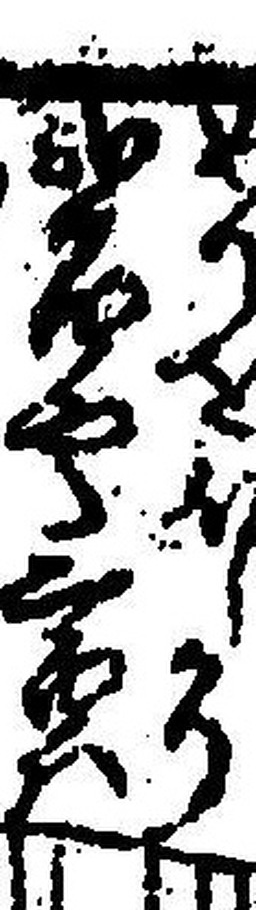弐百や三百は
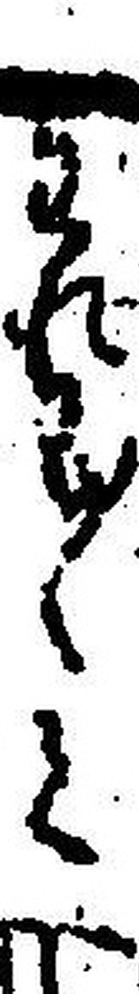われも〳〵と
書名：天竺儲之筋 / 市場通笑作
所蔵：東京大学総合図書館 General Library in the University of Tokyo, JAPAN
